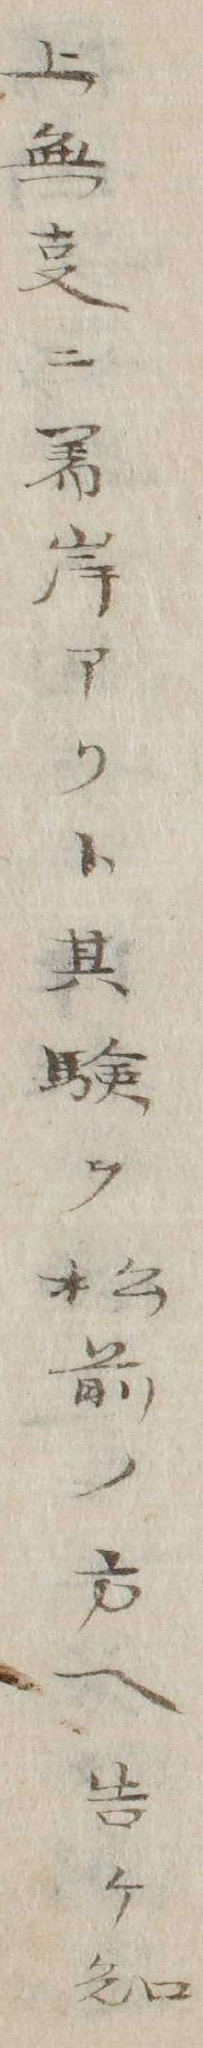上無事ニ着岸アリト其験ヲ松前ノ方ヘ告ケ知
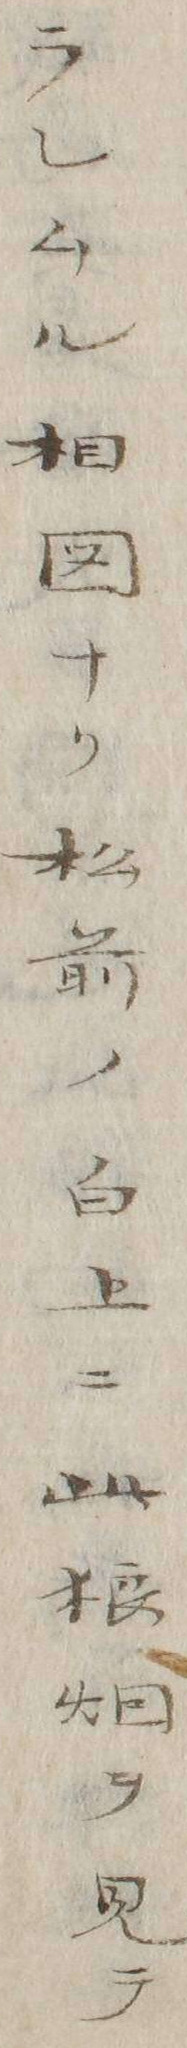ラレムル相図ナリ松前ノ白上ニ此狼煙ヲ見テ
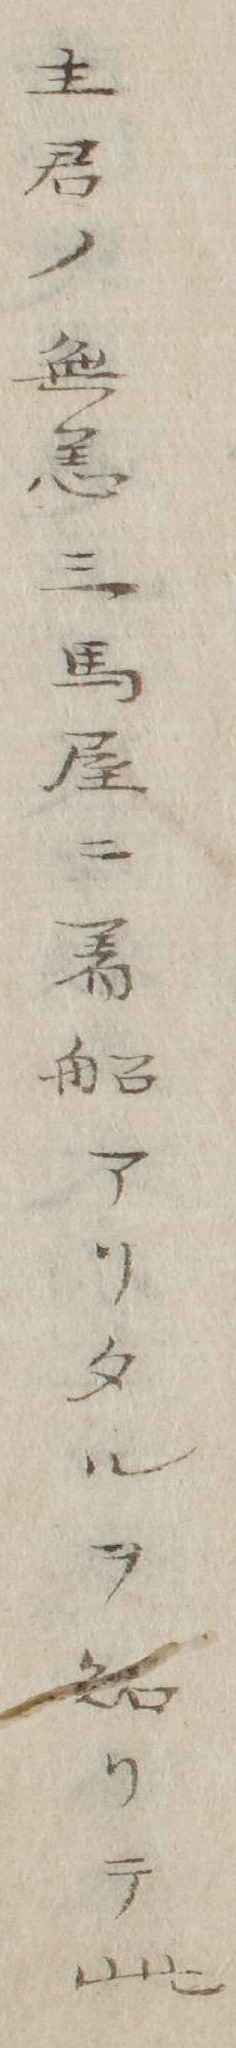主君ノ無恙三馬屋に着船アリタルヲ知リテ此
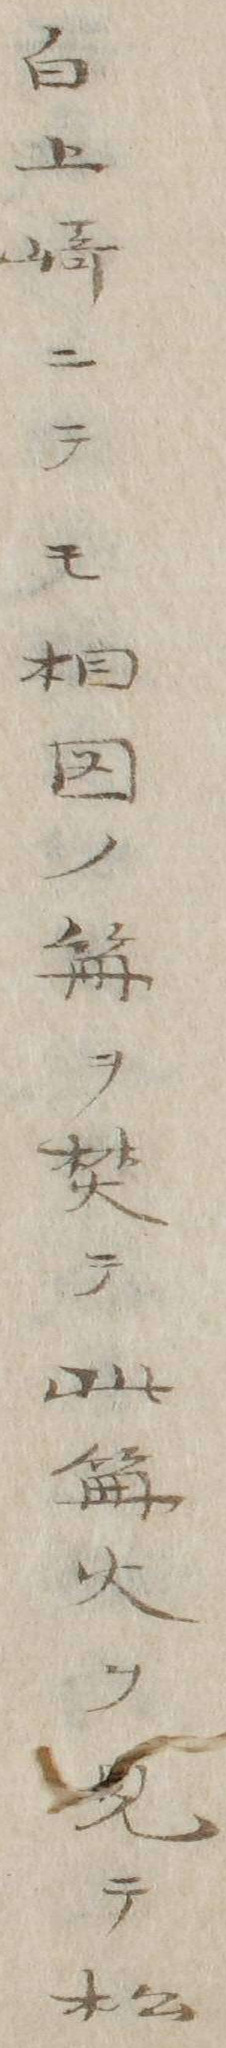白上崎ニテモ相図ノ篝ヲ焚テ此篝火ヲ見テ松

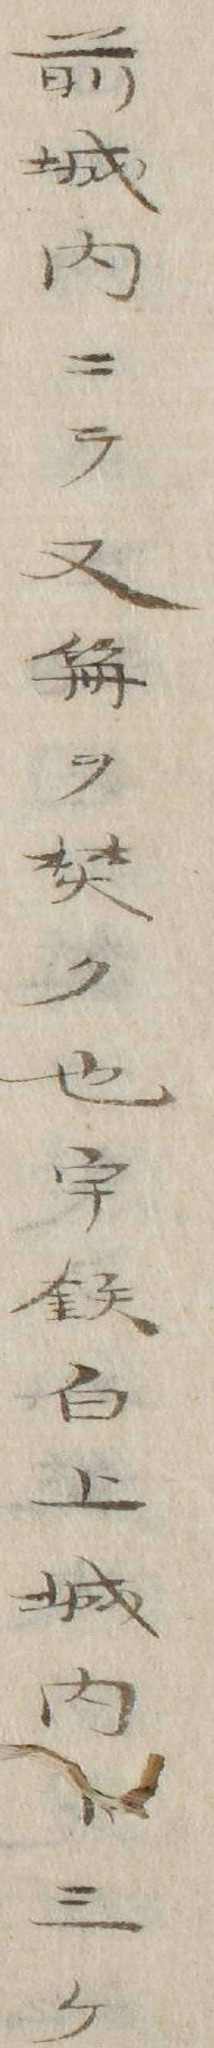前城内ニテ又篝ヲ焚ク也宇鉄白上城内ト三ヶ
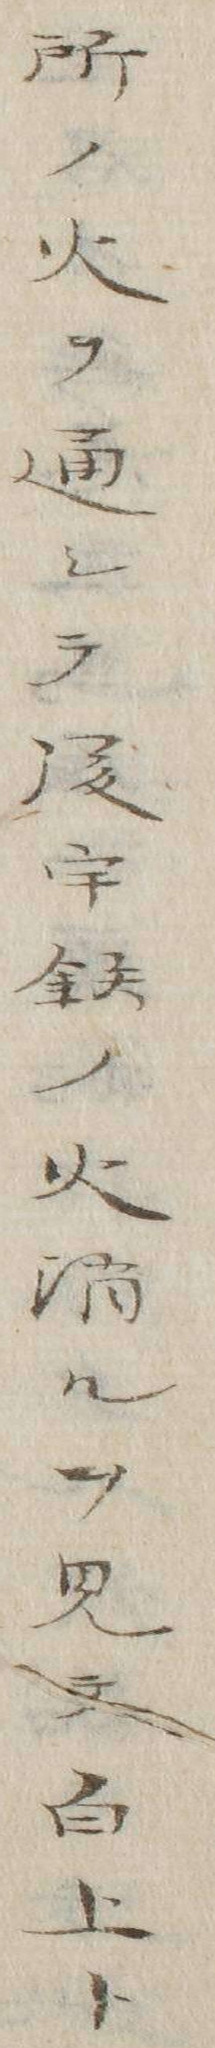所ノ火ヲ通シテ後宇鉄ノ火消ルヲ見テ白上ト
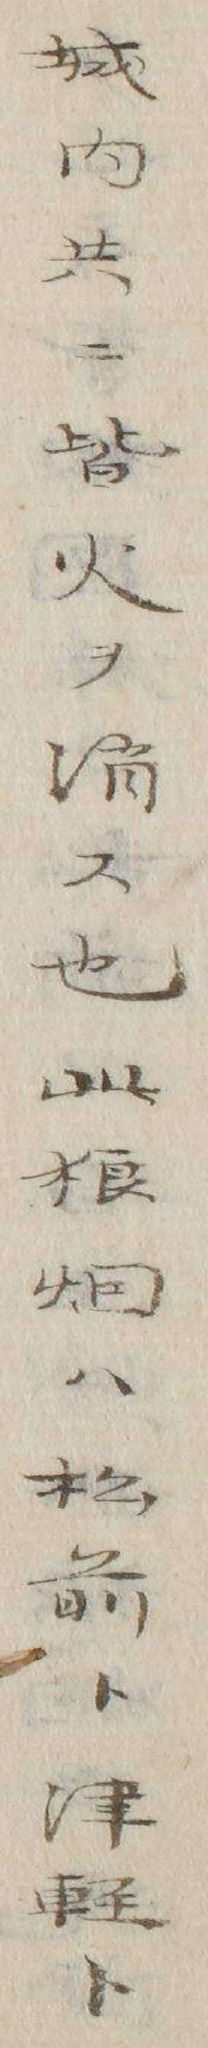城内共ニ皆火ヲ消ス也此狼煙ハ松前ト津軽ト
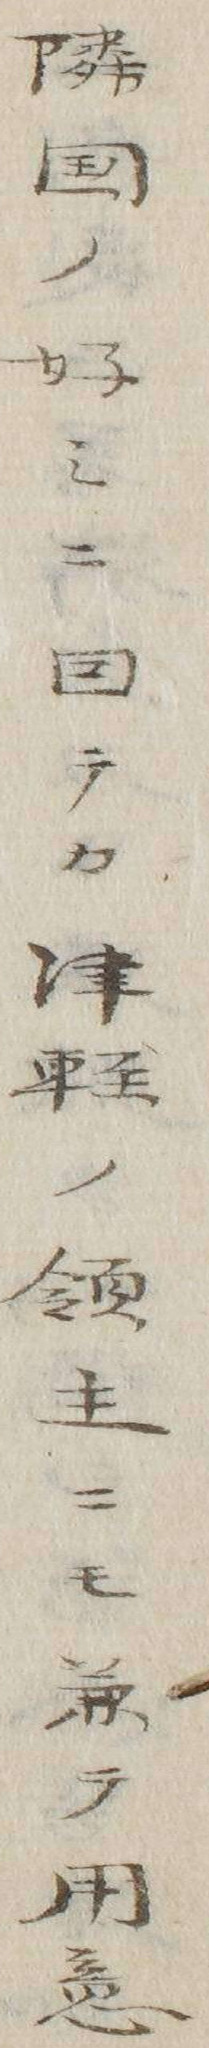隣国ノ好ミニ因テカ津軽ノ領主ニモ兼テ用意
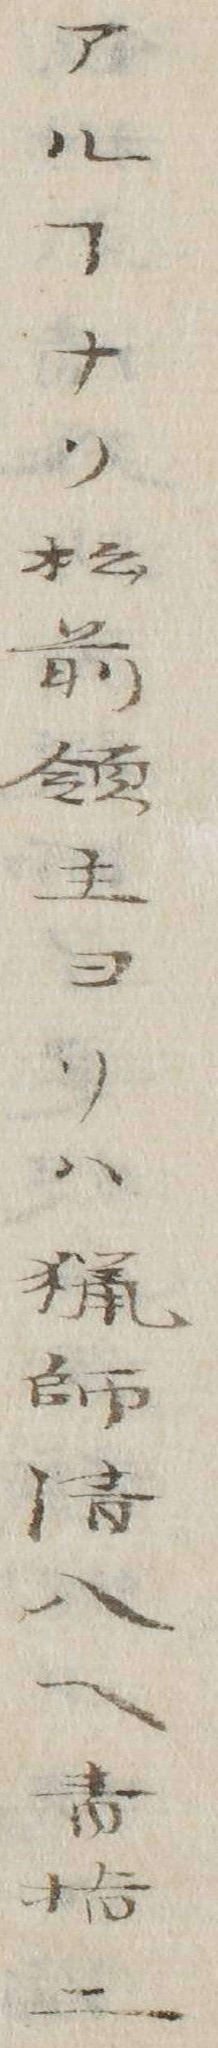アルヿナリ松前領主ヨリハ猟師清八ヘ青指二
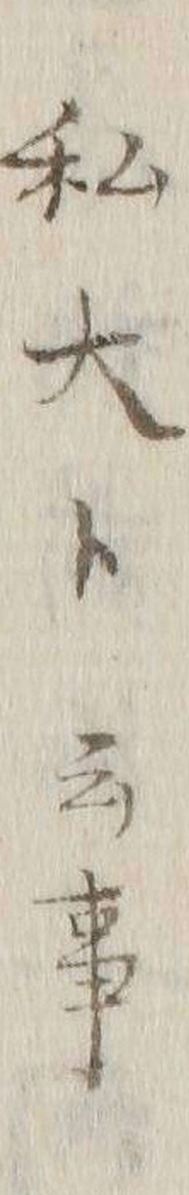私大ト云事
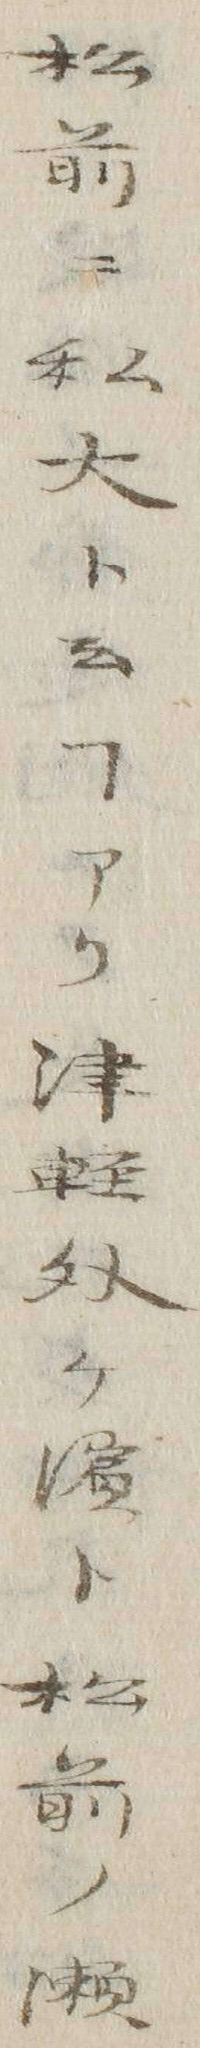松前ニ私大ト云ヿアリ津軽外ヶ浜ト松前ノ瀬
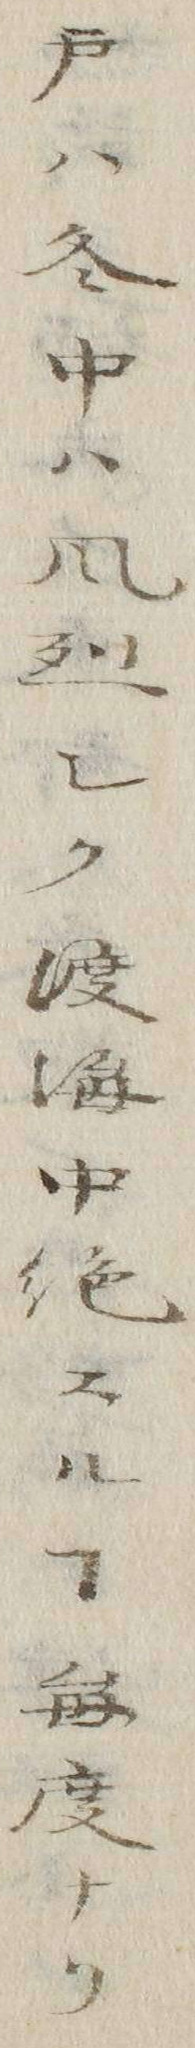戸ハ冬中ハ風烈シク渡海中絶スルヿ毎度ナリ
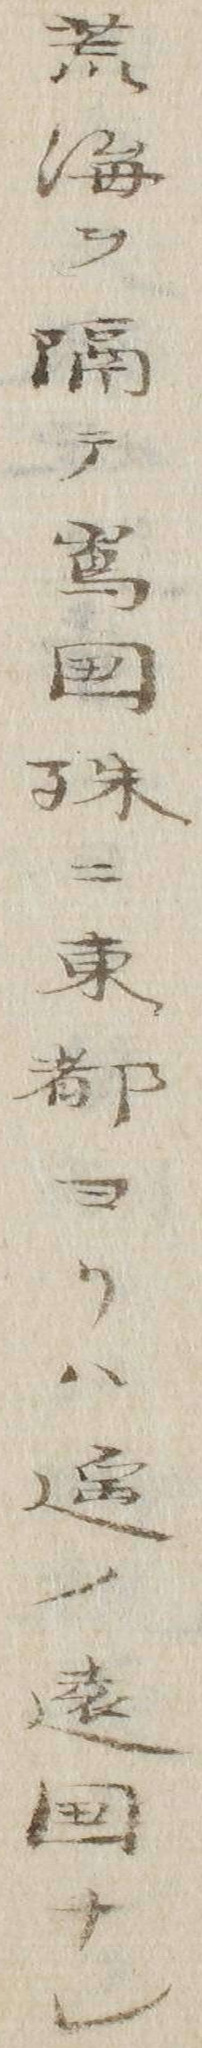荒海ヲ隔テ島国珠ニ東都ヨリハ遥ノ遠国ナレ
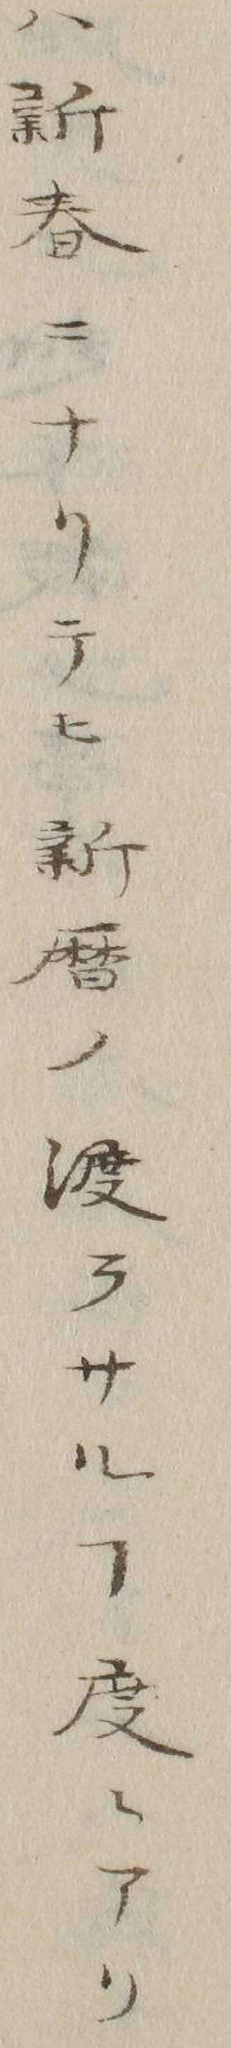ハ新春ニナリテモ新暦ノ渡ラサルヿ度々アリ
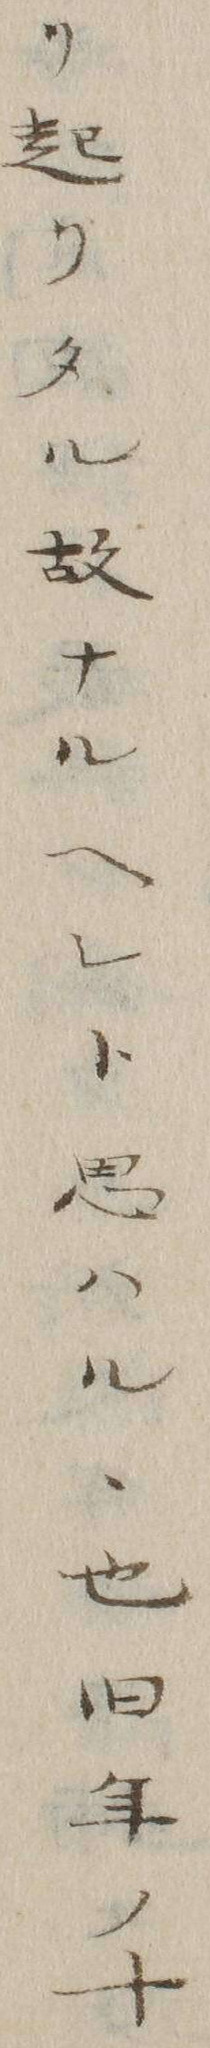リ起リタル故ナルヘシト思ハルヽ也旧年ノ十
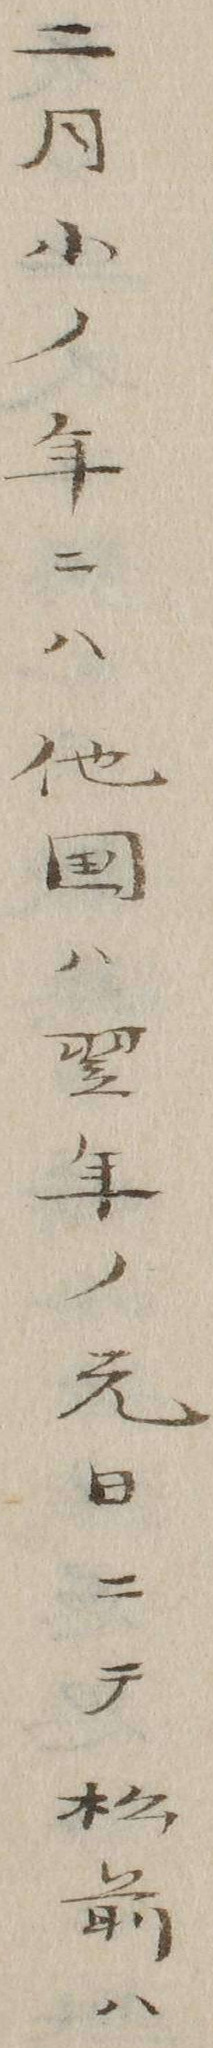二月小ノ年ニハ他国ハ翌年ノ元旦ニテ松前ハ
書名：蝦夷草紙（国文学研究資料館）
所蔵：国文学研究資料館
